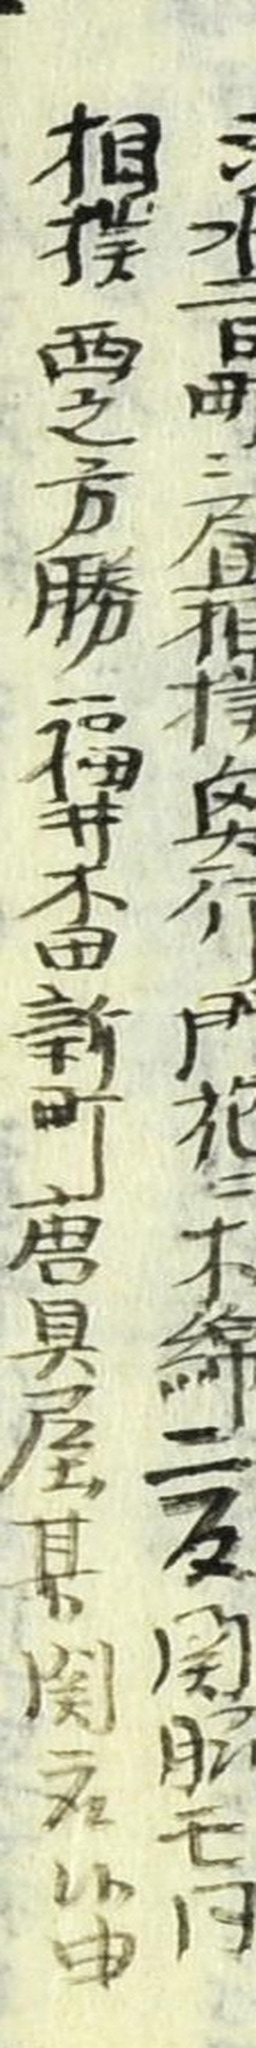相撲西之方勝福井木田新町唐具屋其関取候由
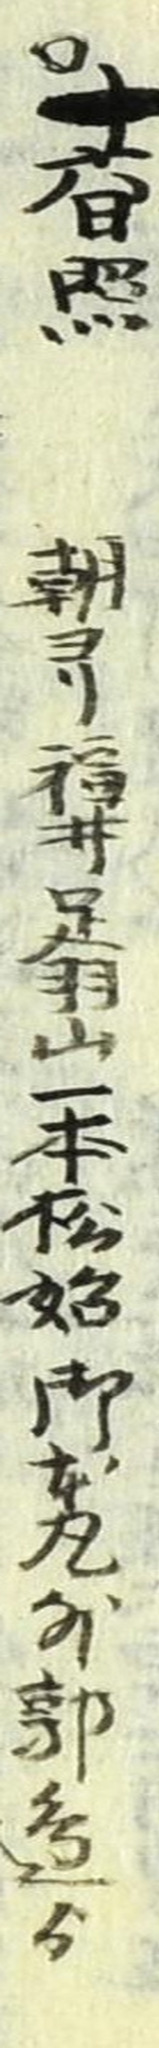○十六日朝ヨリ福井足羽山一本松始御本丸外郭辺ゟ
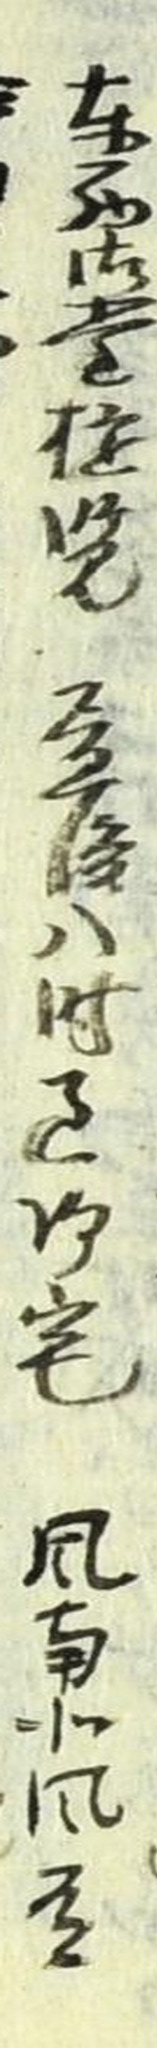東西御堂遊覧昼後八時過帰宅風南北風有
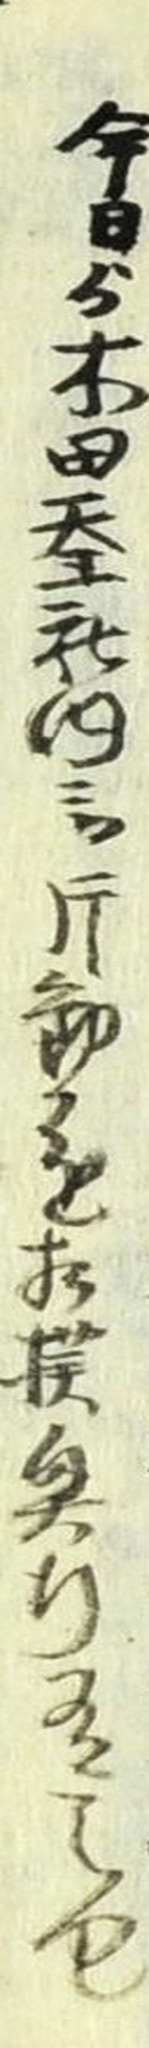今日ゟ木田天王社内ニ而片勧進相撲興行有之由
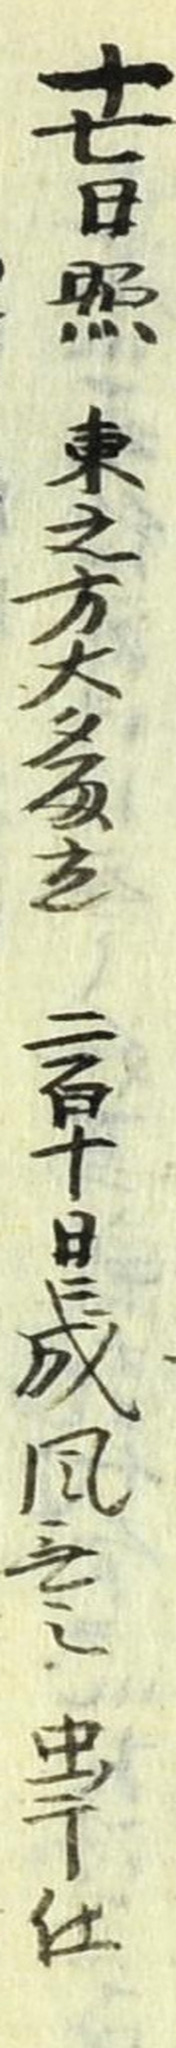十七日照東之方大夕雨立二百十日ニ成風無之虫干仕
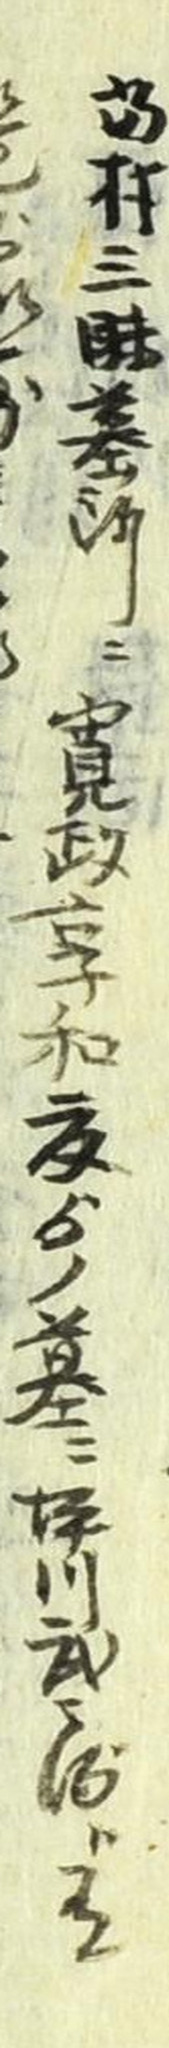当村三昧墓所ニ寛政享和夏ゟノ墓ニ坪川武兵衛ト有
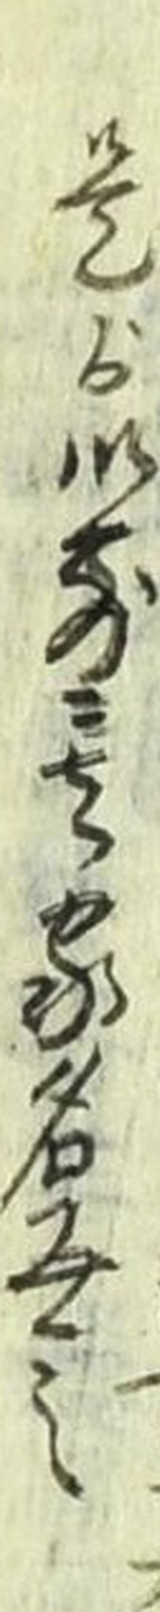是ゟ以前ニ其家名無之
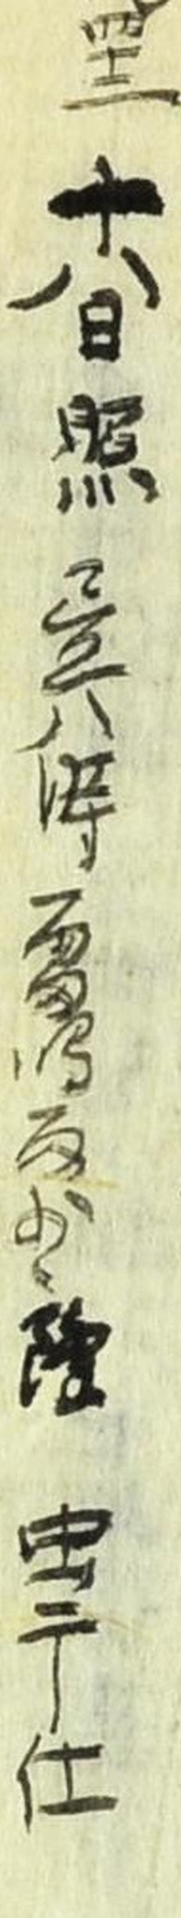十八日照昼八時雷鳴雨少々降虫干仕
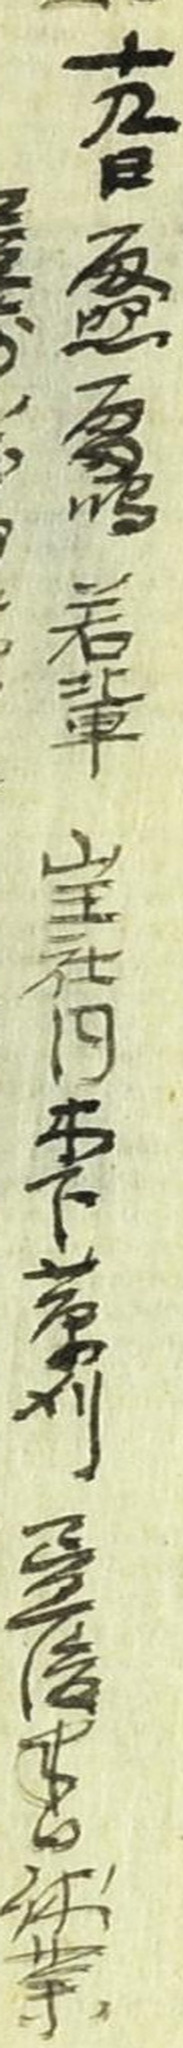○△十九日雨照雷鳴若輩山王社内木下草刈昼後半日休業
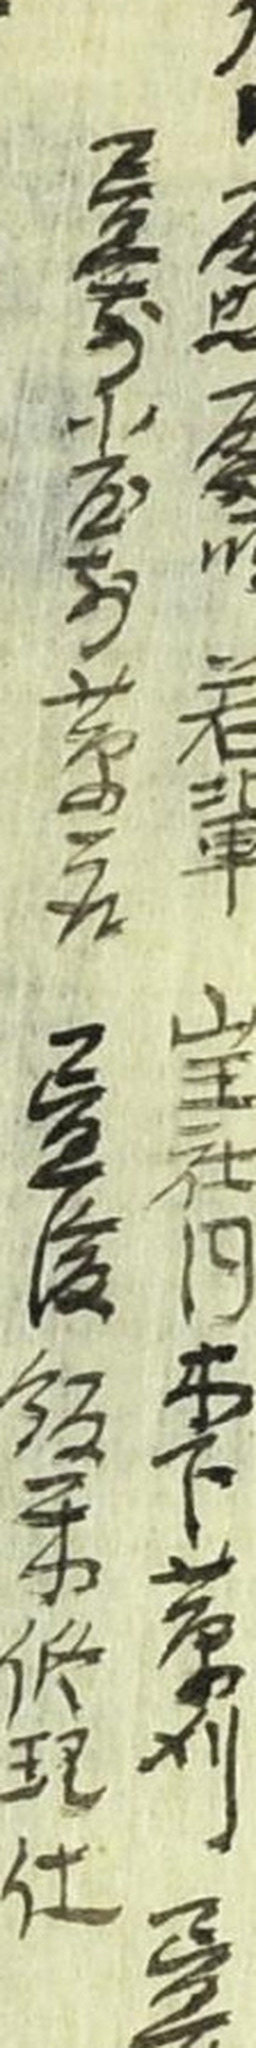昼前小屋前草取昼後飯米修理仕
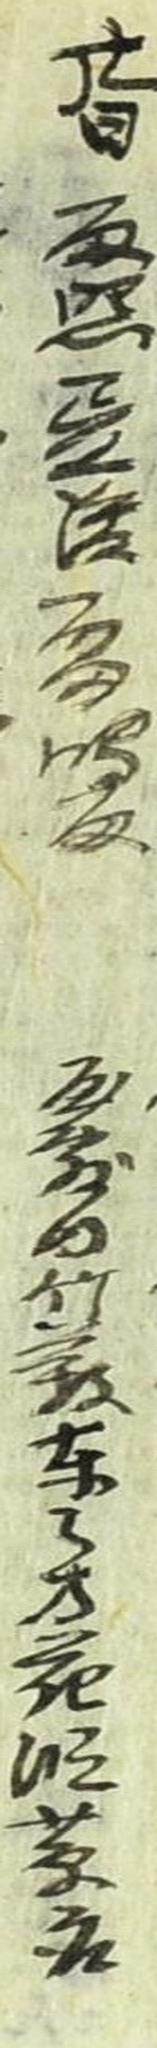廿日雨照昼後雷鳴雨屋敷内竹藪東之方花段草取
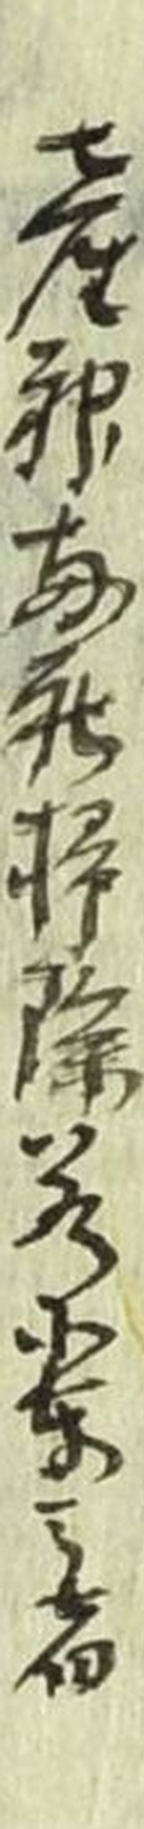産神両社掃除若輩之者
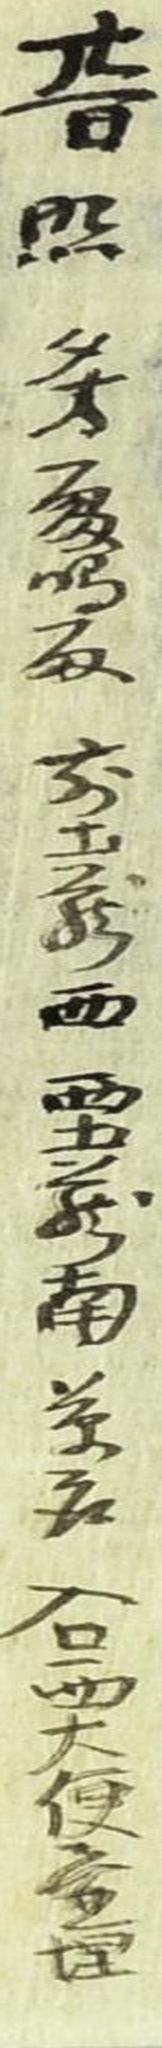廿一日照夕方雷鳴雨前土蔵西西土蔵南草取入口西大便昼埋
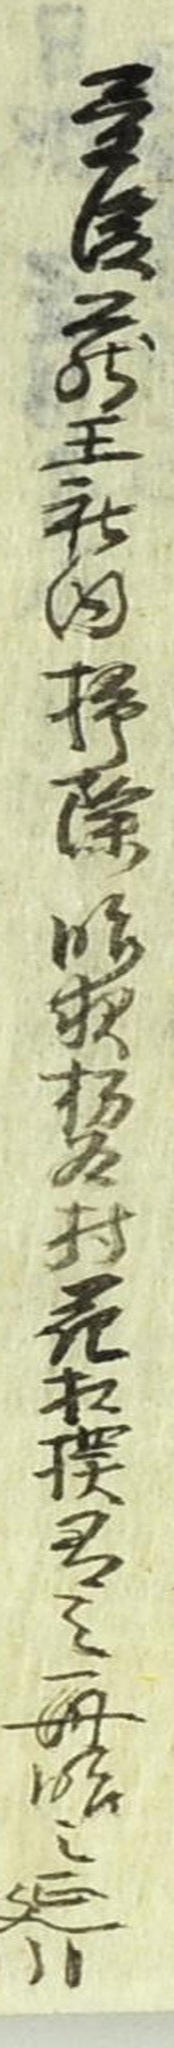昼後蔵王社内掃除昨夜栃谷村花相撲有之再昨之延引ナリ
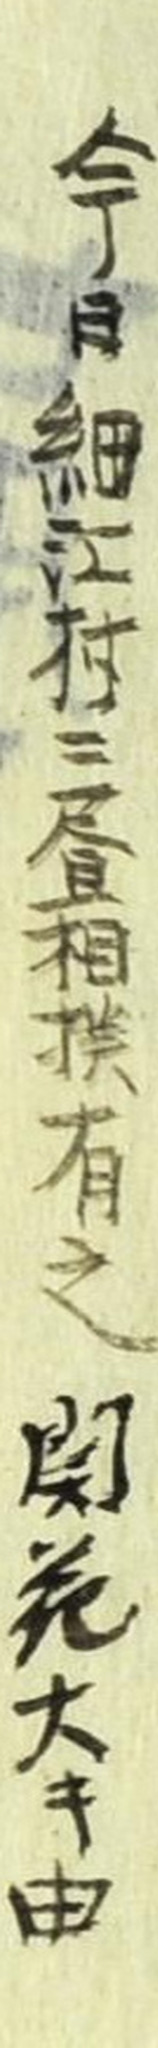今日細江村に昼相撲有之関花大キ由
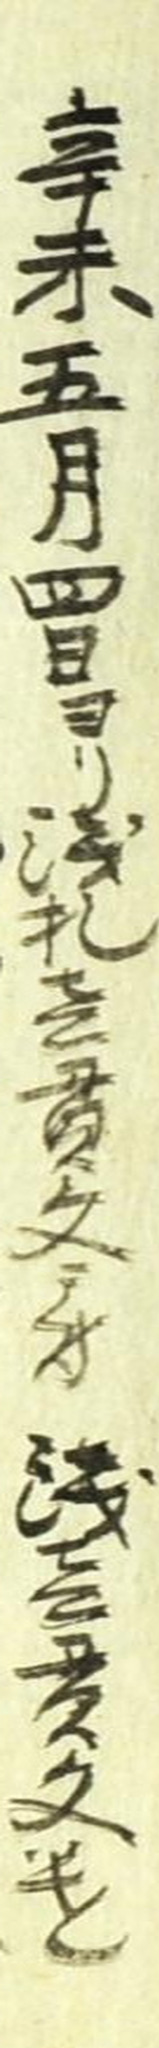辛未五月四日ヨリ銭札壱貫文ニ付銭壱貫文遣
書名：（日記）
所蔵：福井県文書館 Fukui Prefectural Archives
